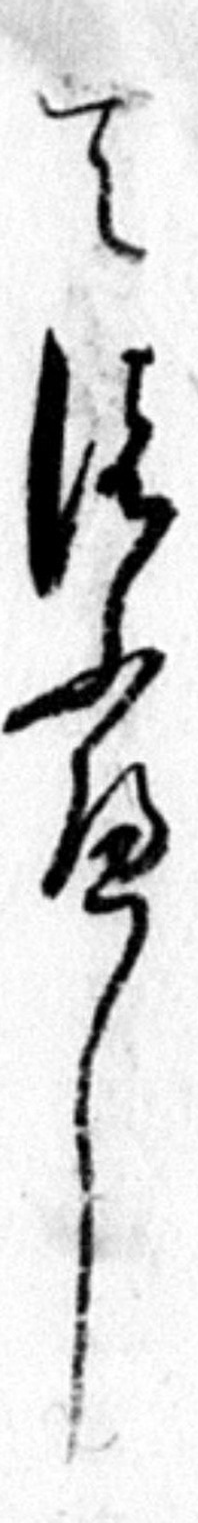て洗うへし
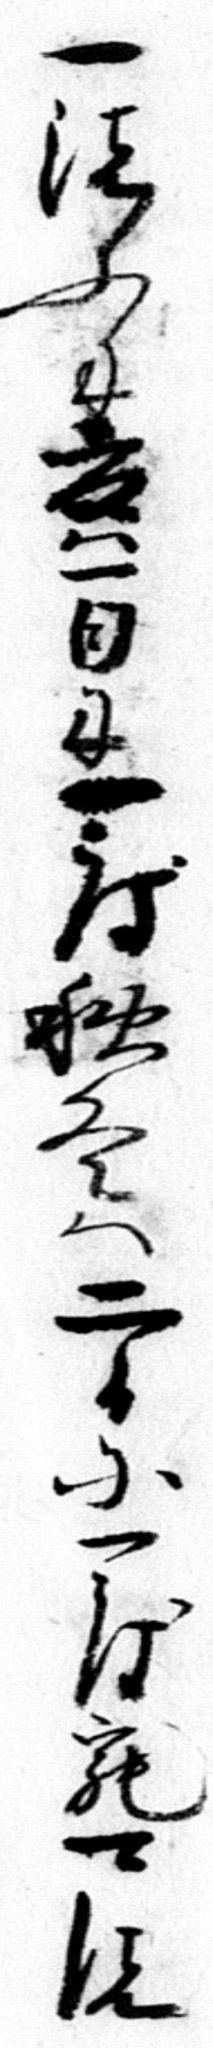一洗ふに夏は一日に一度秋冬は二日に一度宛可洗
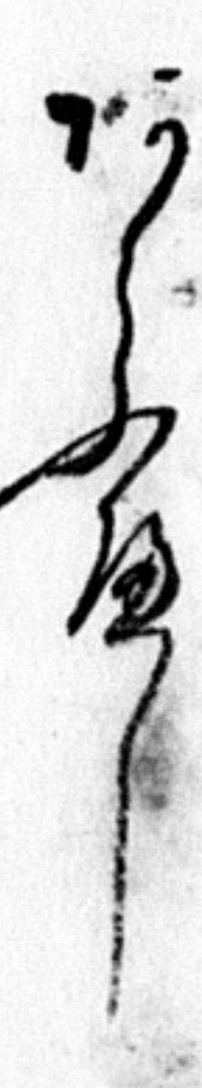あらふへし
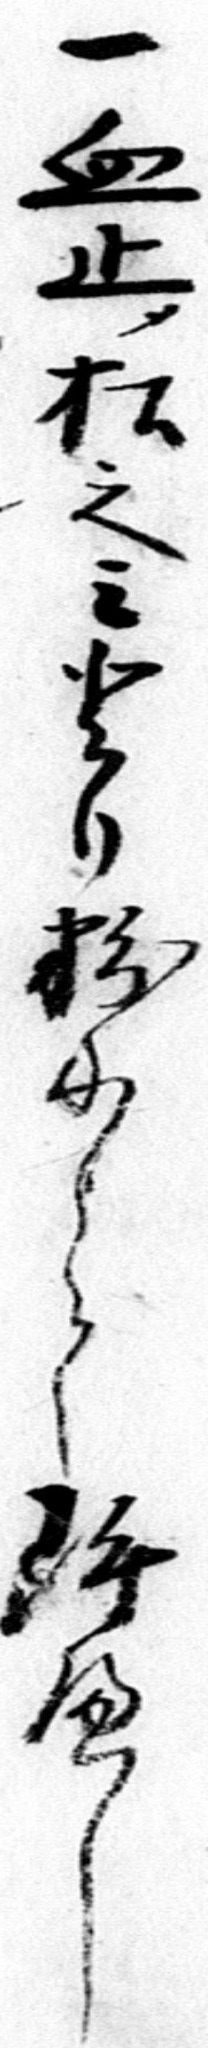一血止め松のみとり粉にして付へし
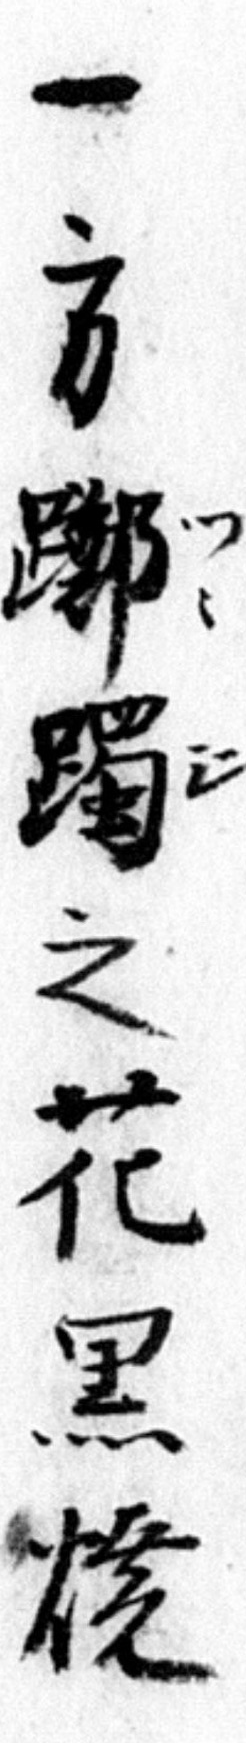一方躑躅之花黒焼
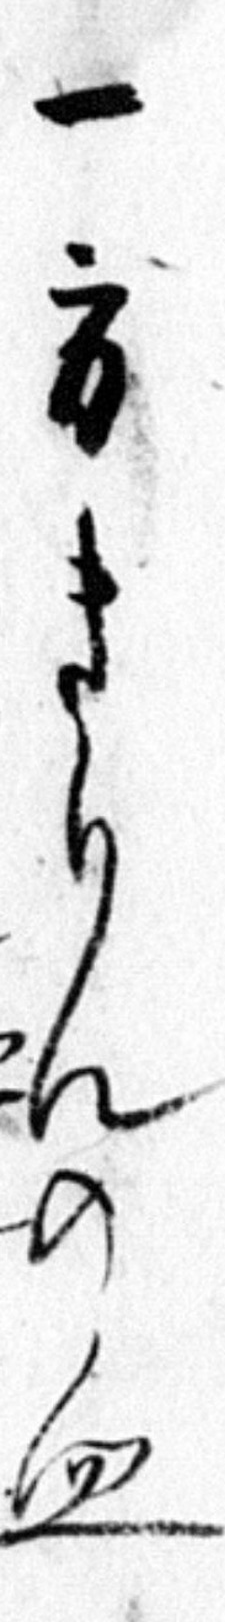一方きりんの血
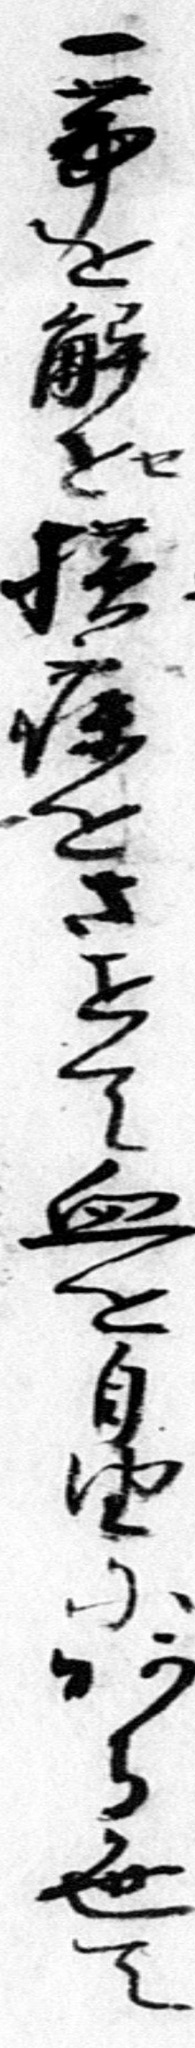一帯を解せ横寝させて血を自由にあるかせて
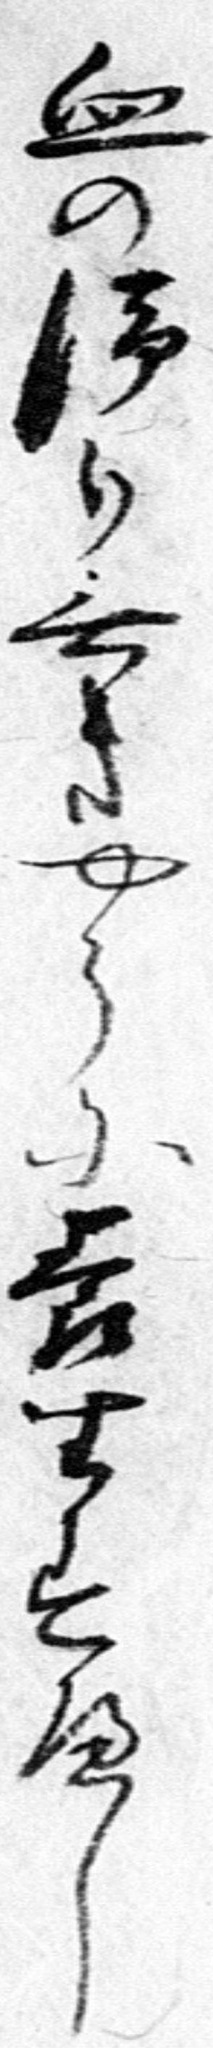血の滞り無きやうに養生すへし
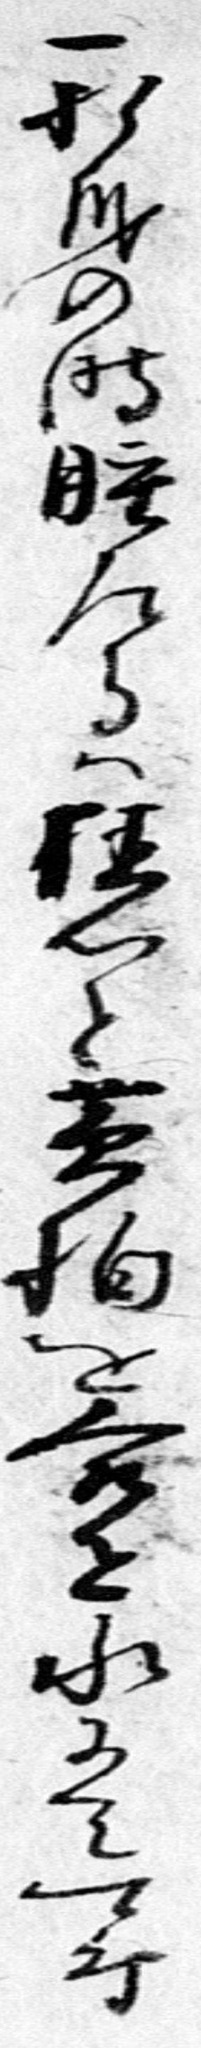一折身の時腫れけるは桂いと黄柏を合せ水にて可付
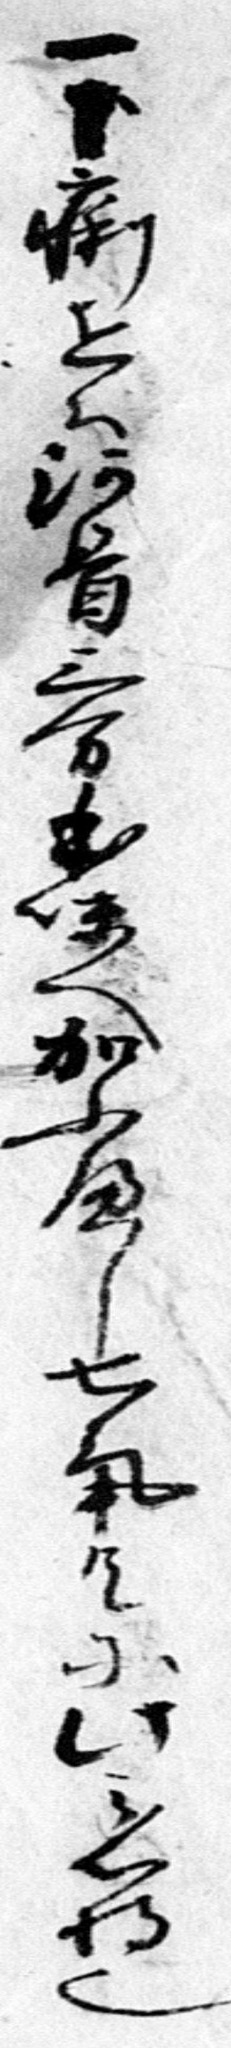一下痢せは河骨三分本味へ加ふへし七気共に此の心持也
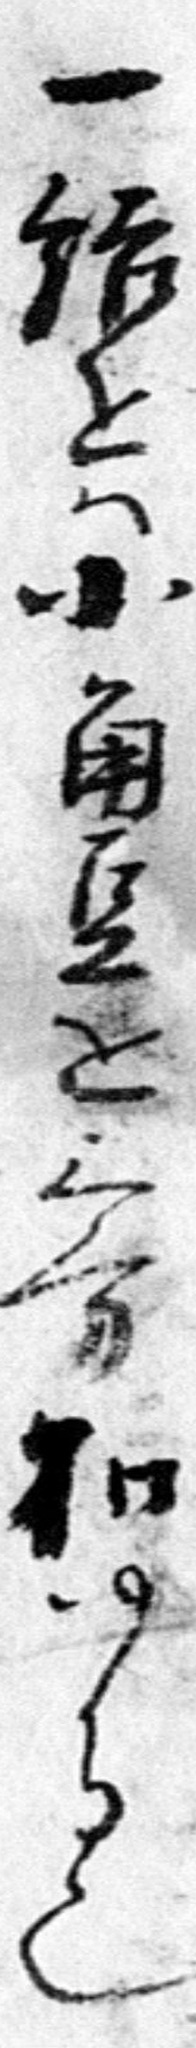一詰せは小角豆を三分加ゆる也
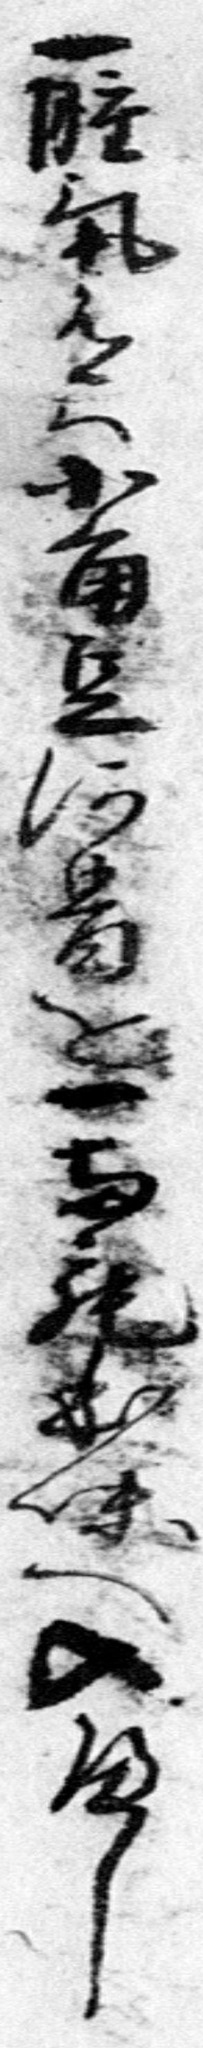一腫気有は小角豆河骨を一両宛本味へ入へし

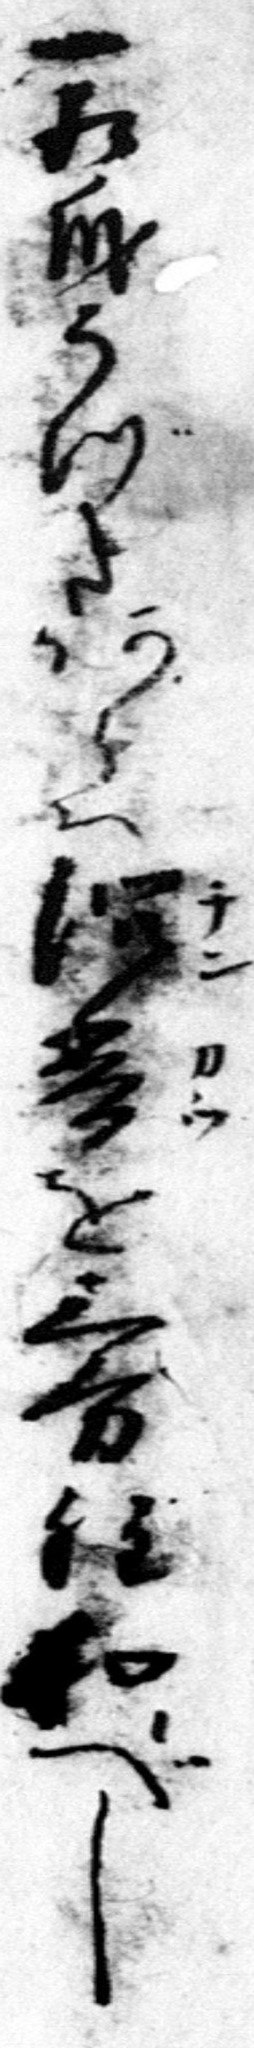一打身うつきあらは沈香を三分程加べし
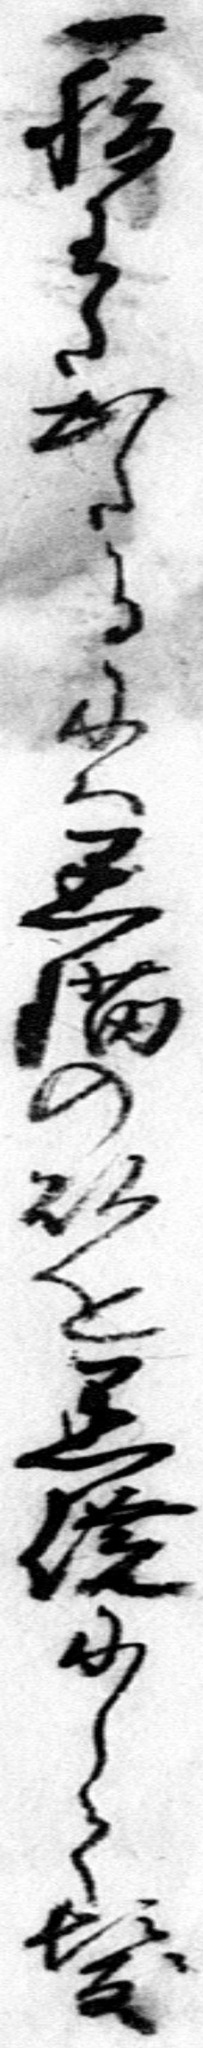一腹わた出たるには黒猫のいを黒焼にして髪
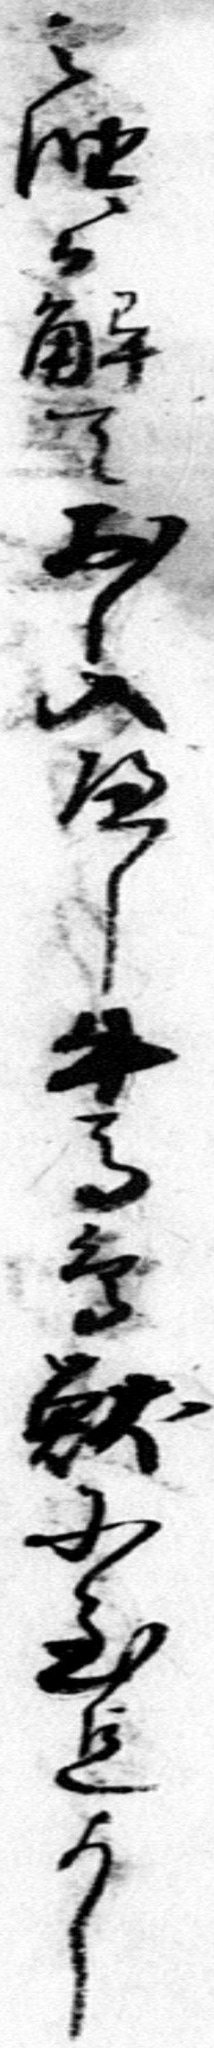之油にて解ておし入へし牛馬鳥獣に至迄よし
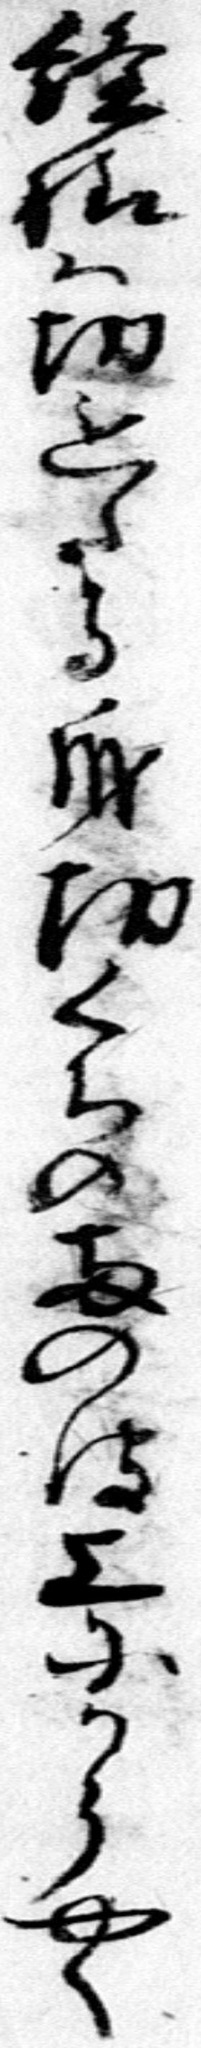縫様は切れたる身切くちの両の皮上にかうやく
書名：名薬秘伝之書
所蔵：徳島県立図書館
